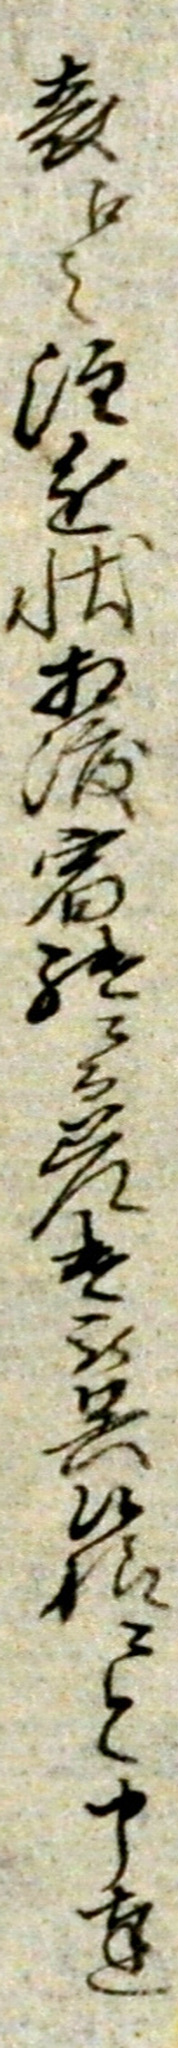表江之注進状相渡宿継ニ而差遣被呉候様ニと申達
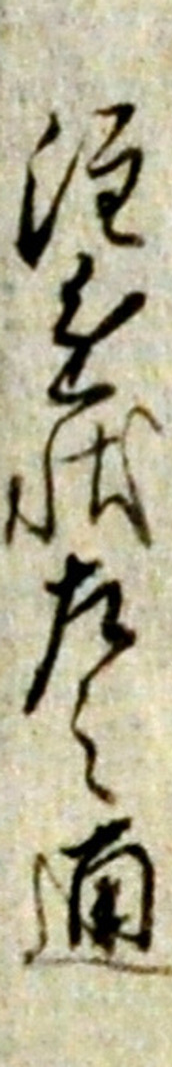注進状左之通
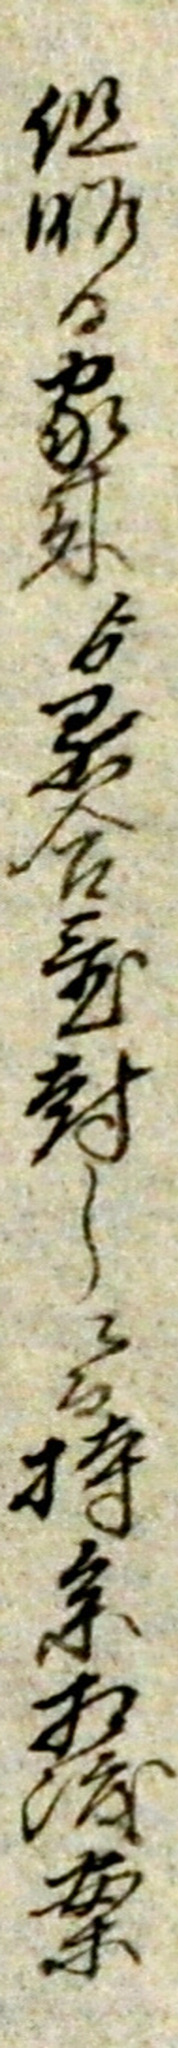但昨日家来ゟ懸合置封しニ而持参相渡案
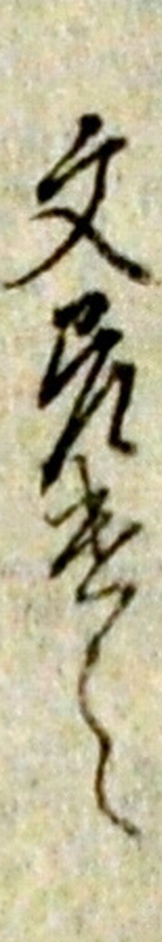文差遣之
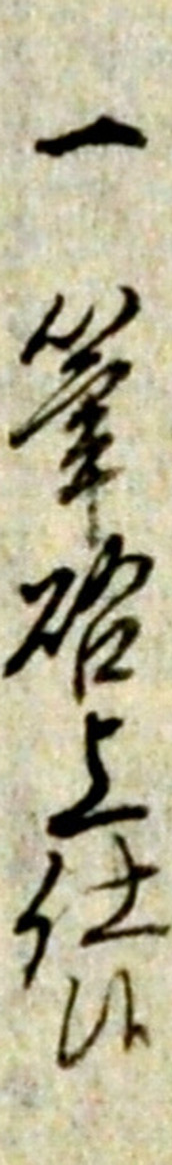一筆啓上仕候
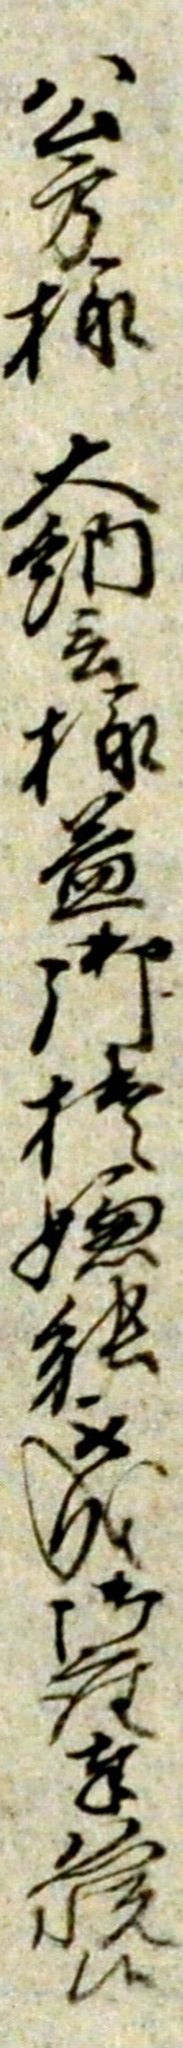公方様大納言様益御機嫌能被成御座奉恐悦候
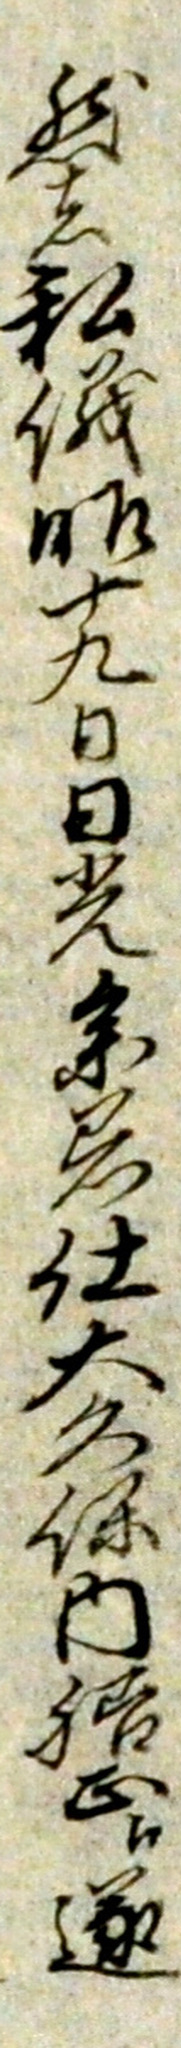然者私儀昨十九日日光参着仕大久保内膳正江遂
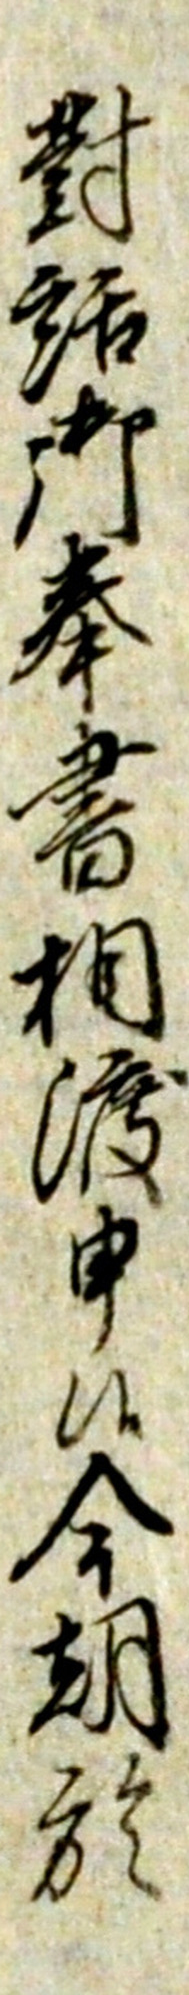対話御奉書相渡申候今朝於
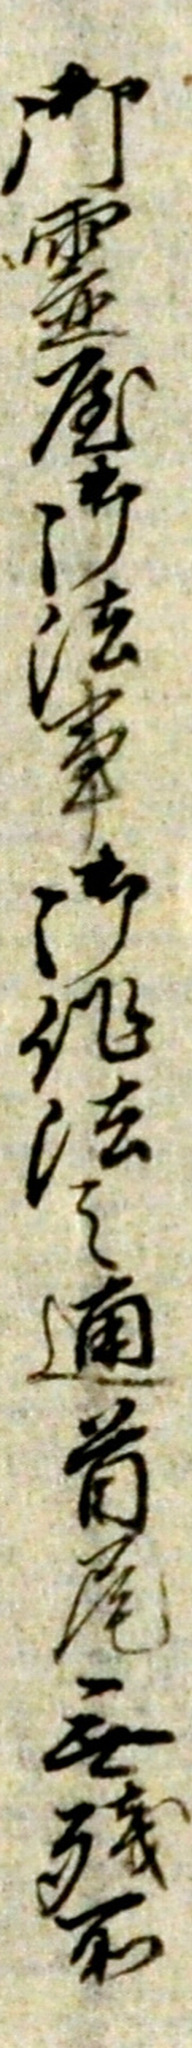御霊屋御法事御作法之通首尾無残所
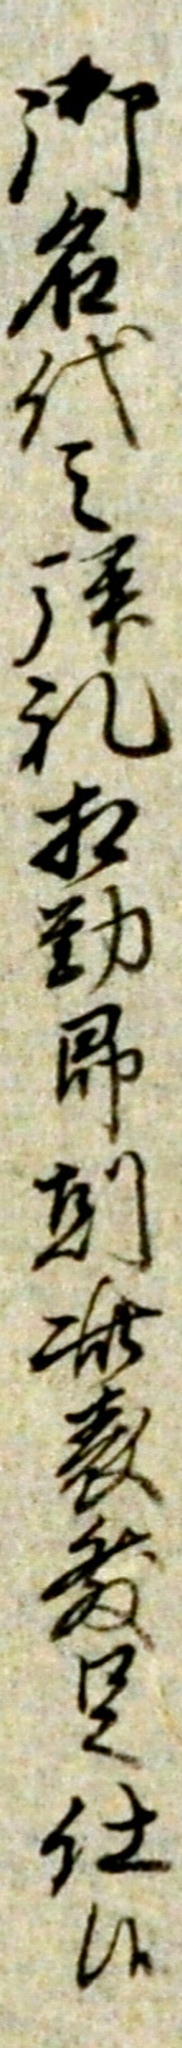御名代者拝礼相勤即刻此表敷足仕候
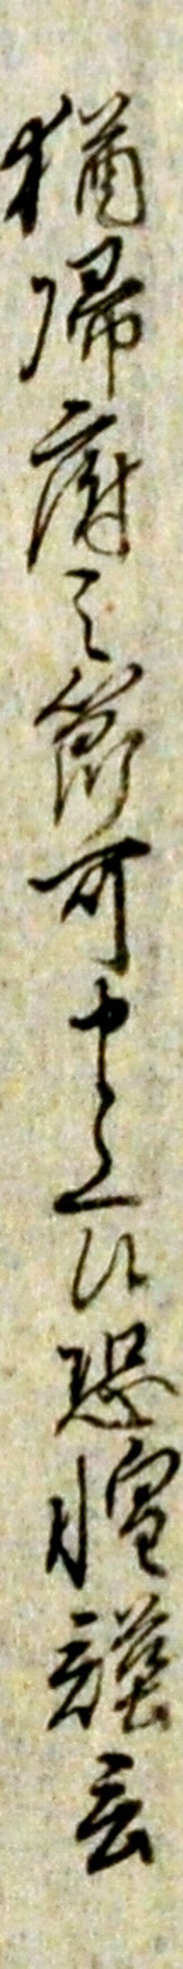猶帰府之節可申上候恐惶謹言
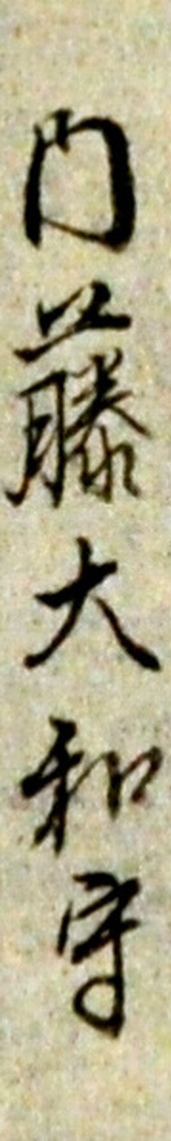内藤大和守
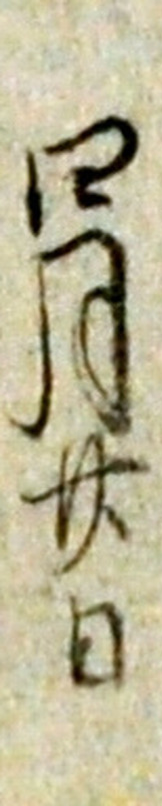四月廿日
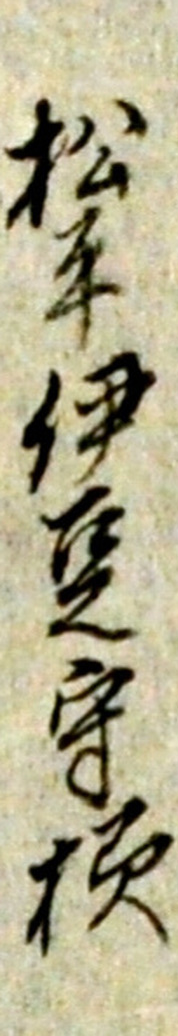松平伊豆守様
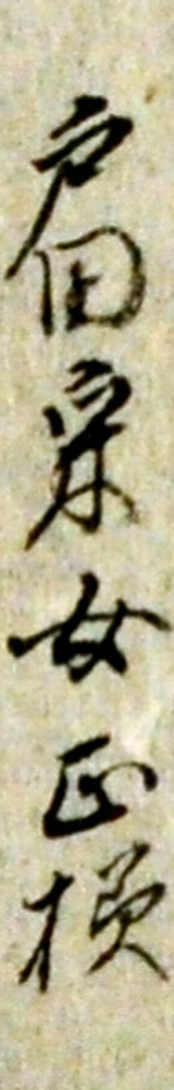戸田采女正様
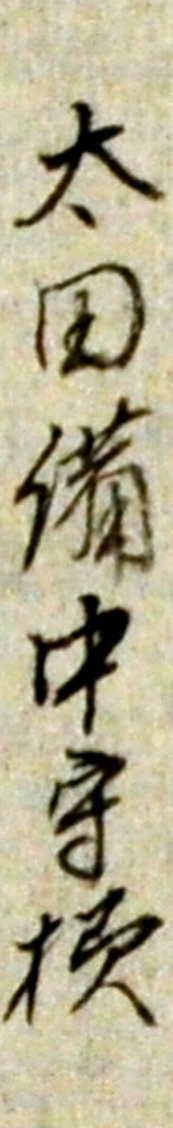太田備中守様
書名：日光御名代相勤候節ノ留
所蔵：伊那市立高遠町図書館・合同会社AMANE
